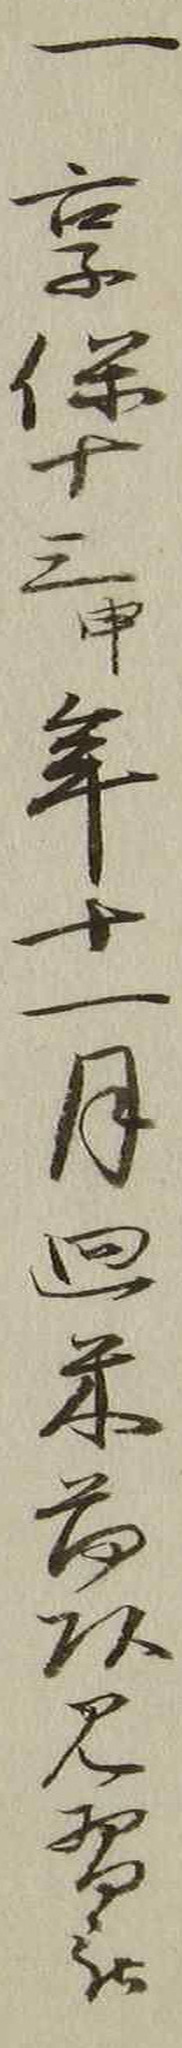一享保十三申年十一月廻米荷頭見習被
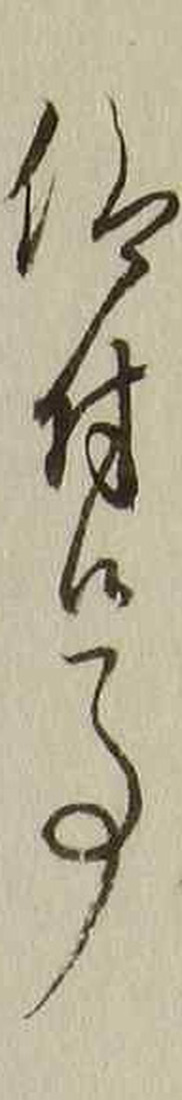仰付候事
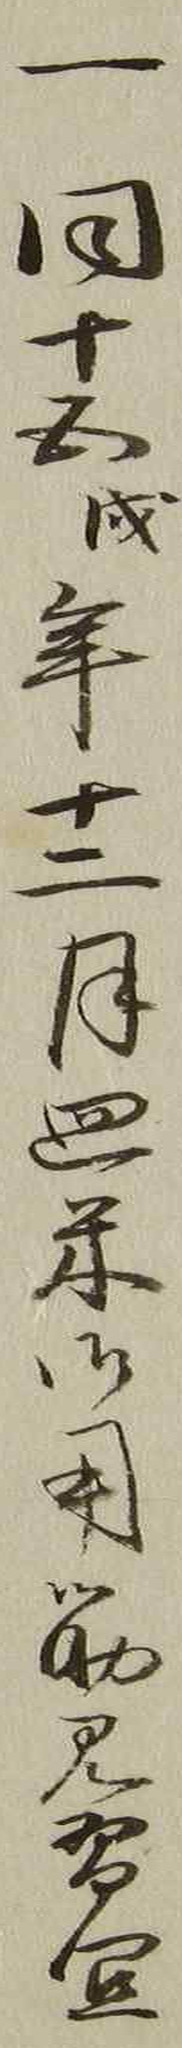一同十五戌年十二月廻米御用勤も習宣
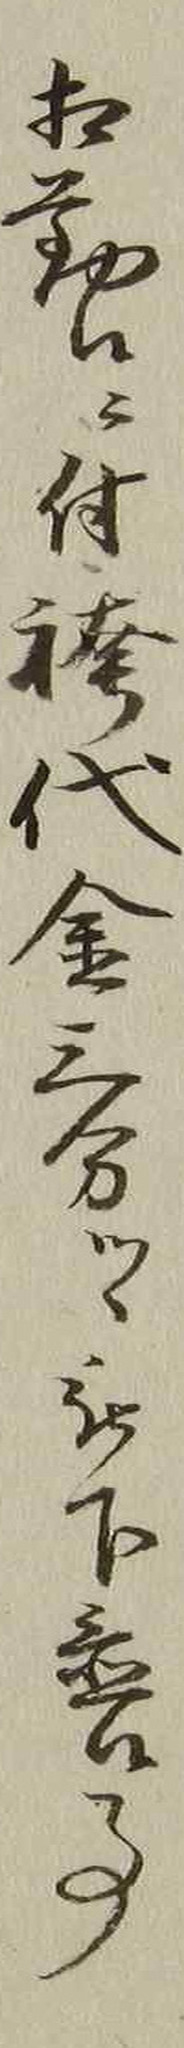相勤候ニ付袴代金三分ツヽ被下置候事
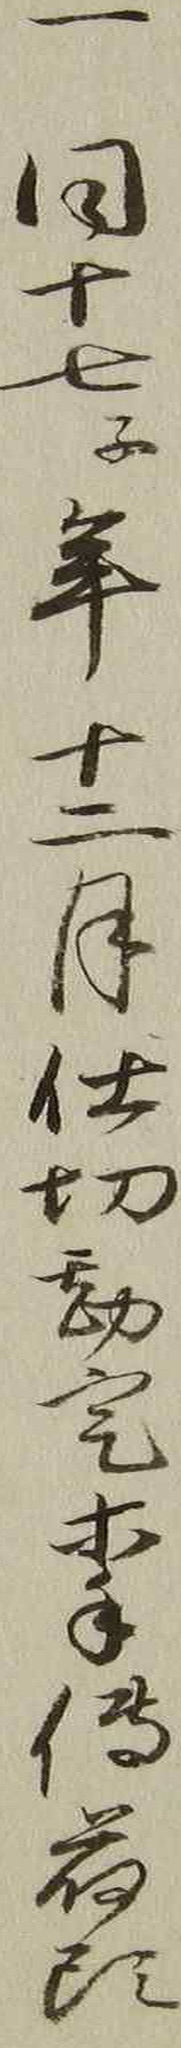一同十七子年十二月仕切勘定等手伝荷頭
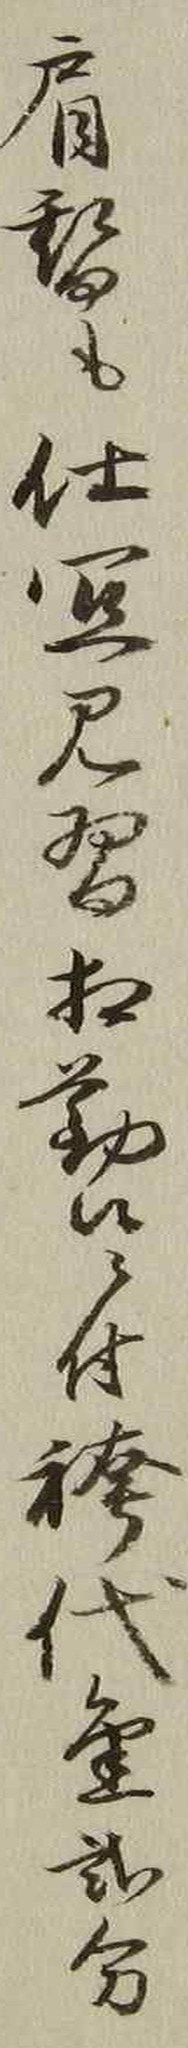肩替も仕宜見習相勤候二付袴代金弐分
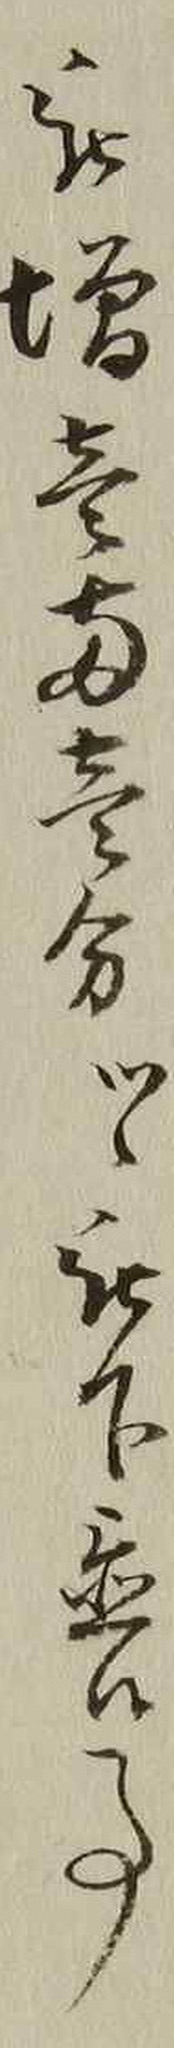被増壱両壱分ツヽ被下置候事
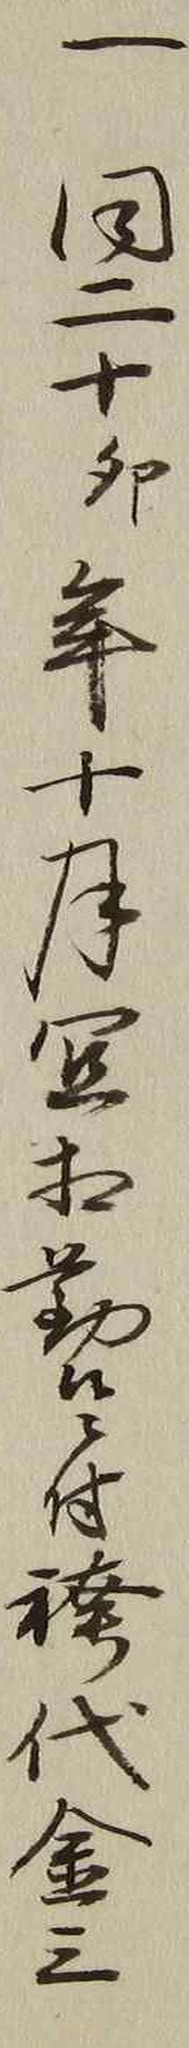一同二十夘年十月宣相勤候二付袴代金三
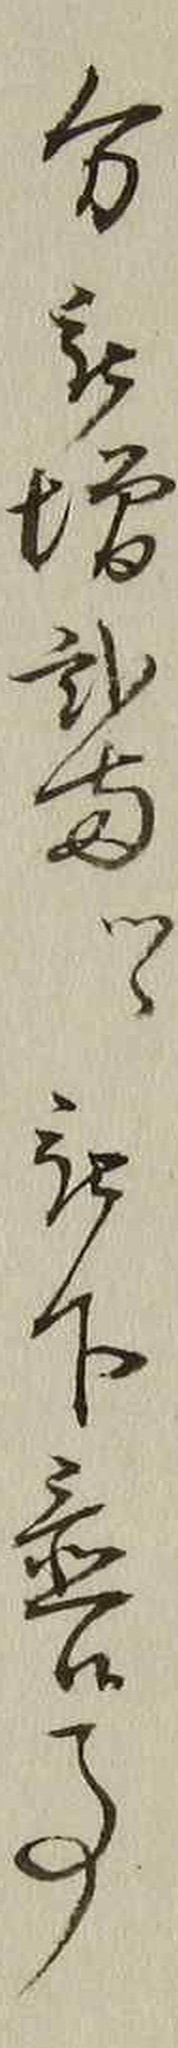分被増弐両ツヽ被下置候事
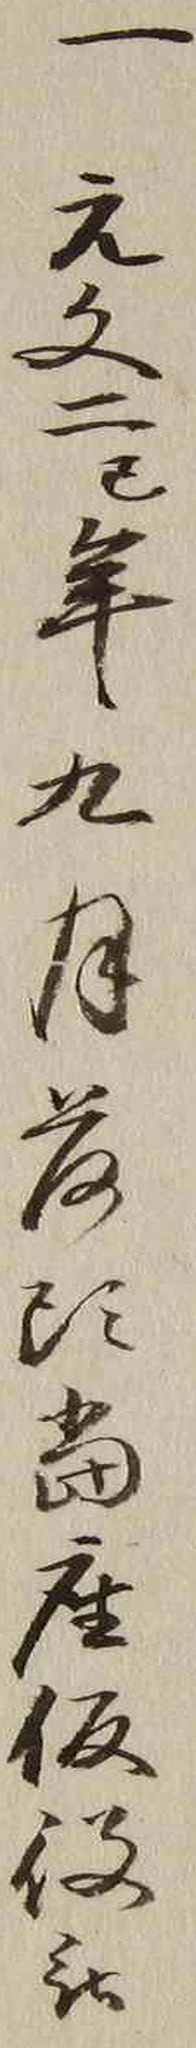一元文二巳年九月荷頭当座仮役被
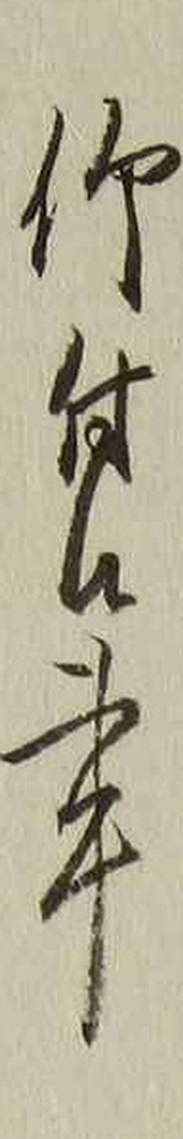仰付候事
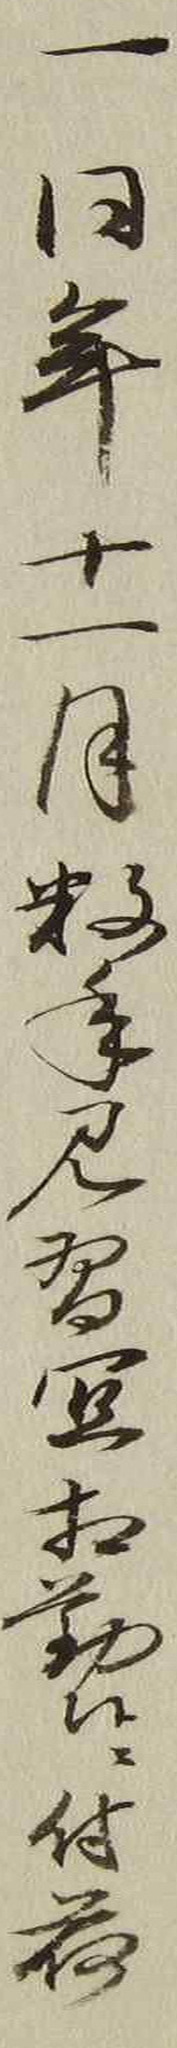一同年十一月数年見習宣相勤候二付荷
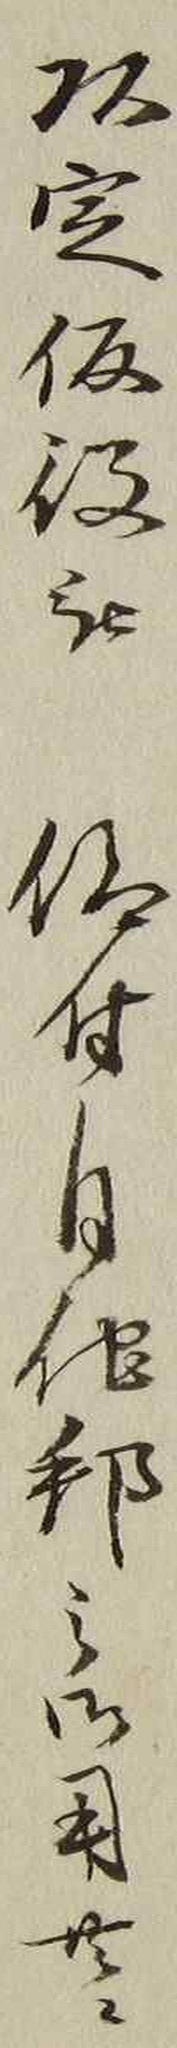頭定仮役被仰付自他邦之御用共ニ
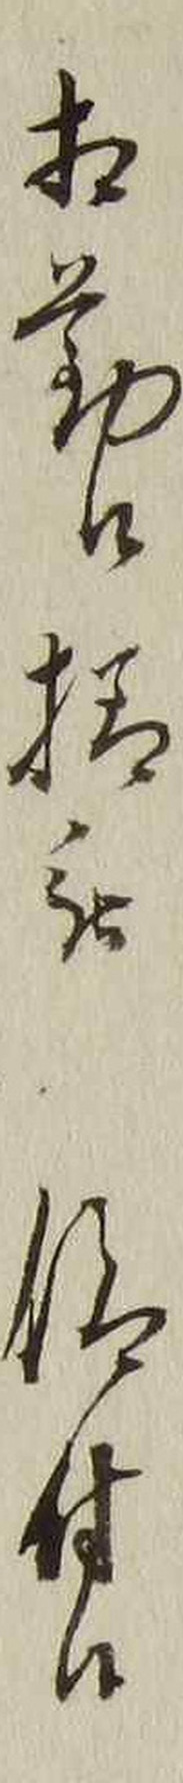相勤候様被仰付候
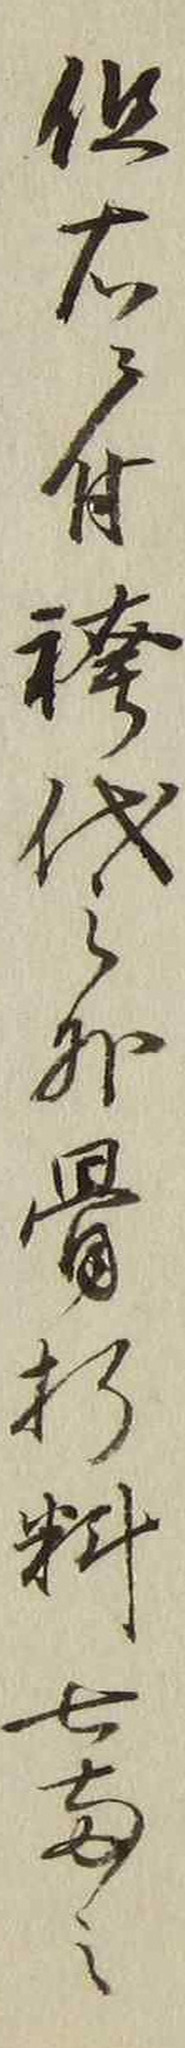但右ニ付袴代之外骨折料七両之
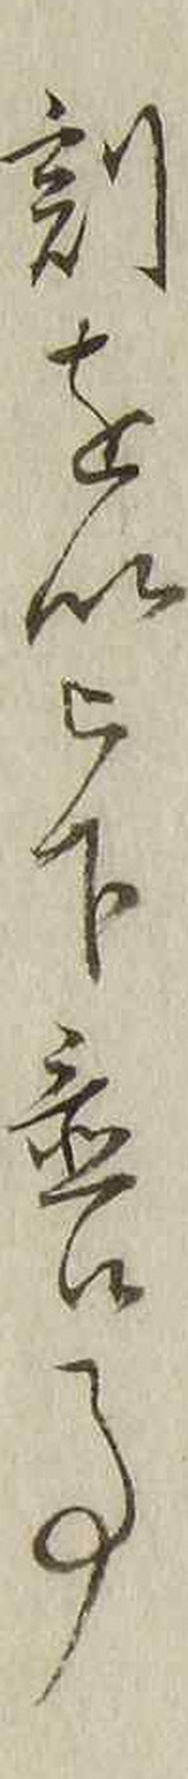割を以被下置候事
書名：諸士系譜　巻之114　か之部22
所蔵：会津若松市立会津図書館
